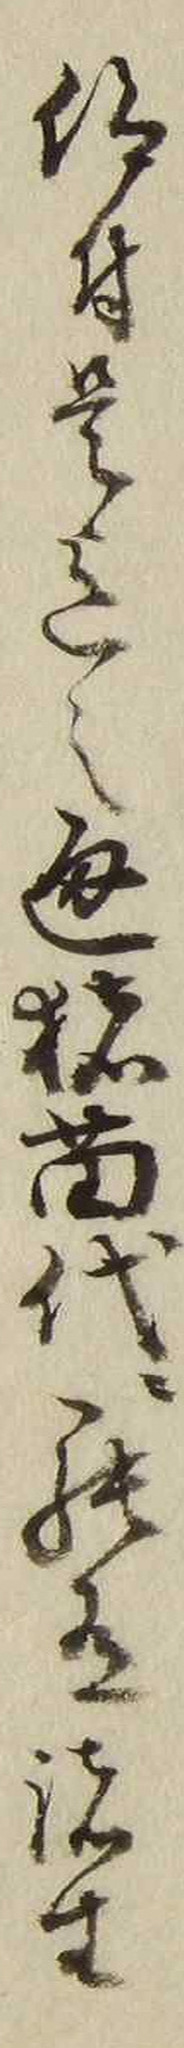仰付是迄之通猪苗代ニ罷有諸生

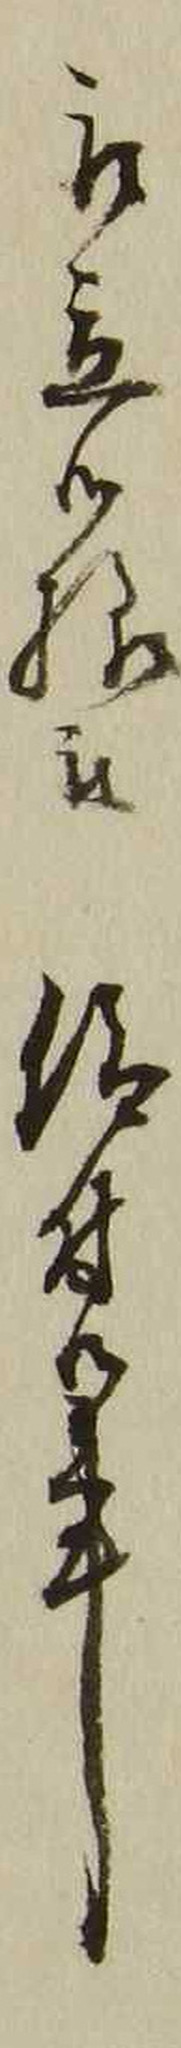取立候様被仰付候事
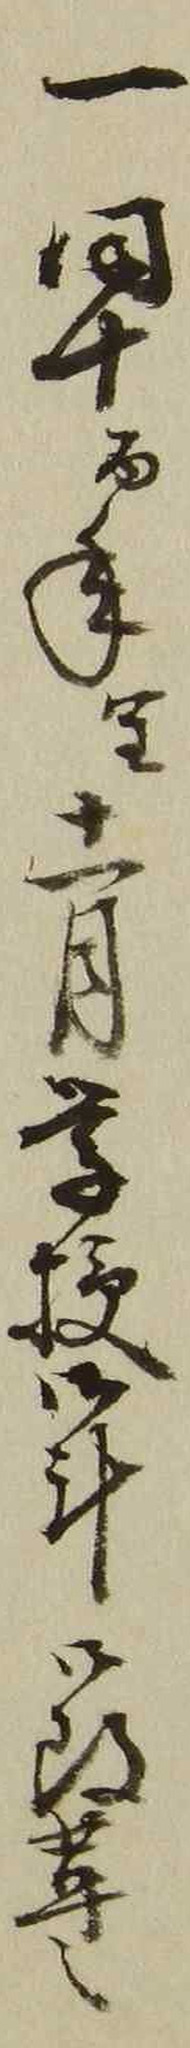一同十酉年閏十一月学校御計御改革之
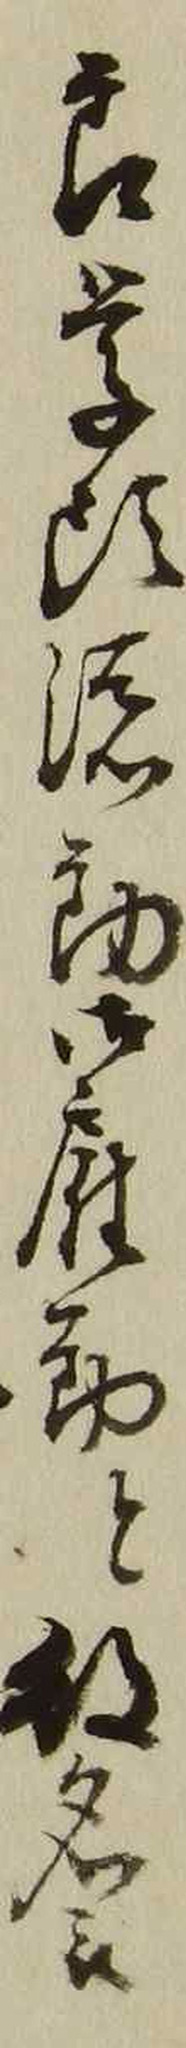節学頭諸勤雇勤と改名被
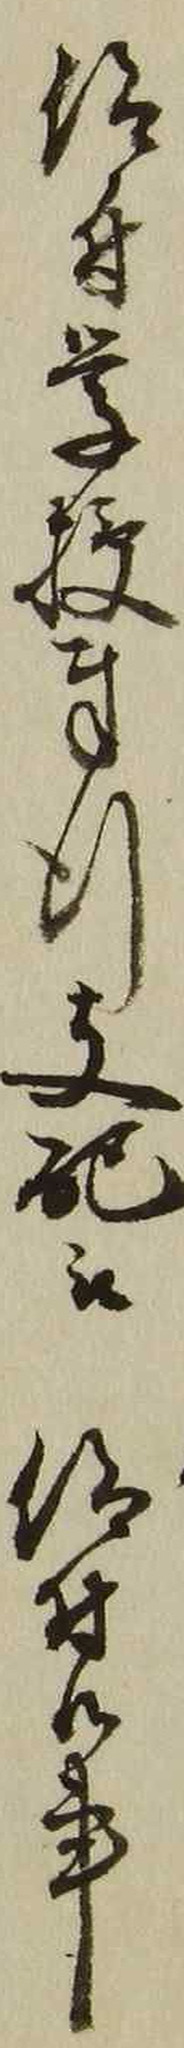仰付学校奉行支配被仰付候事
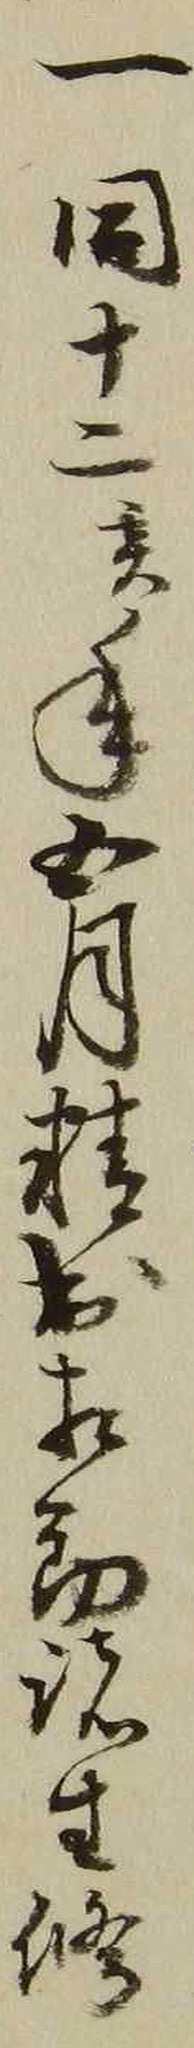一同十二亥年五月精出相勤諸生修
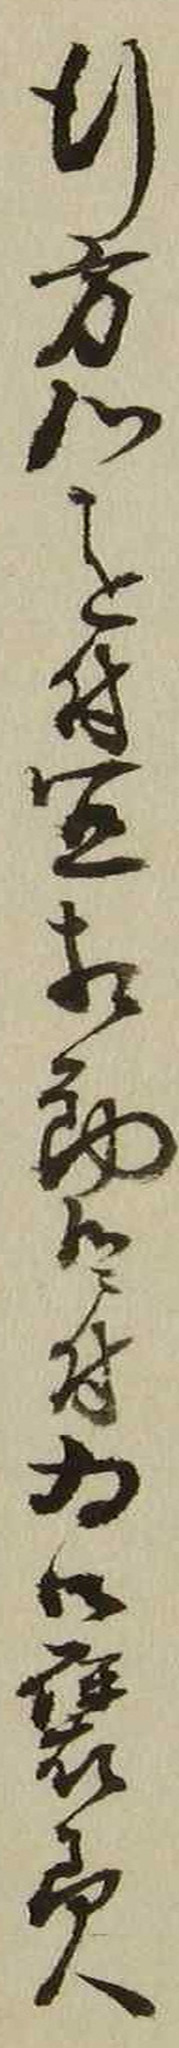行方心を付宜相勤候ニ付為御褒美
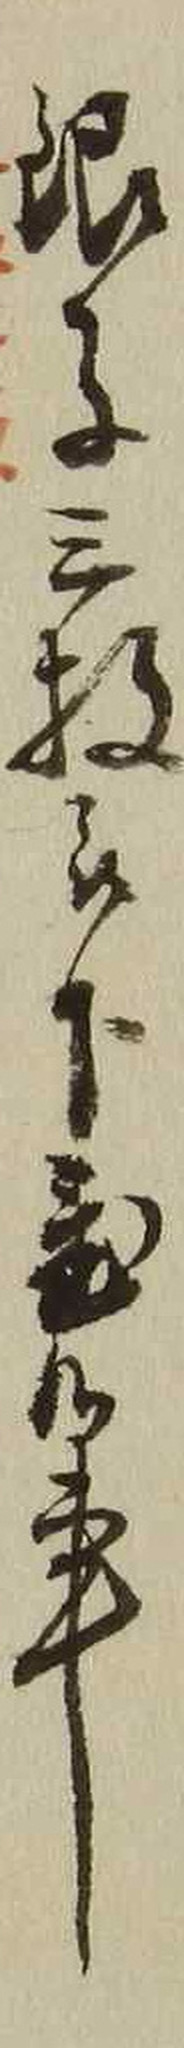銀子三枚被下置候事
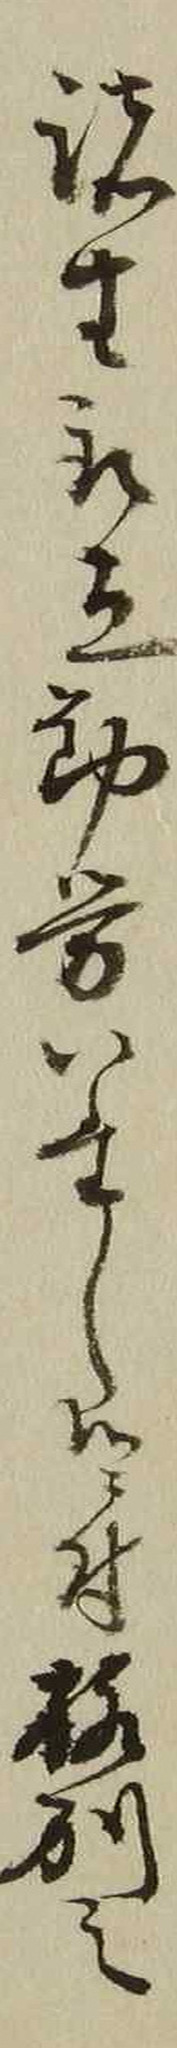諸生取立勤労いたし候ニ付格別之
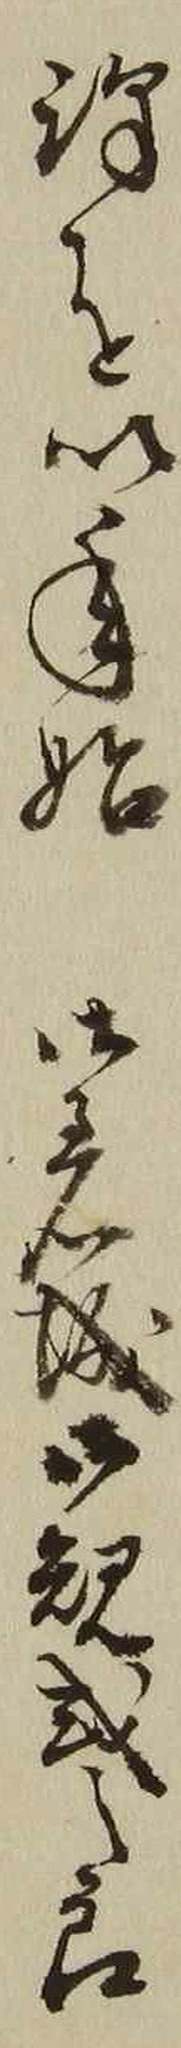訳を以年始御着城御規式之節
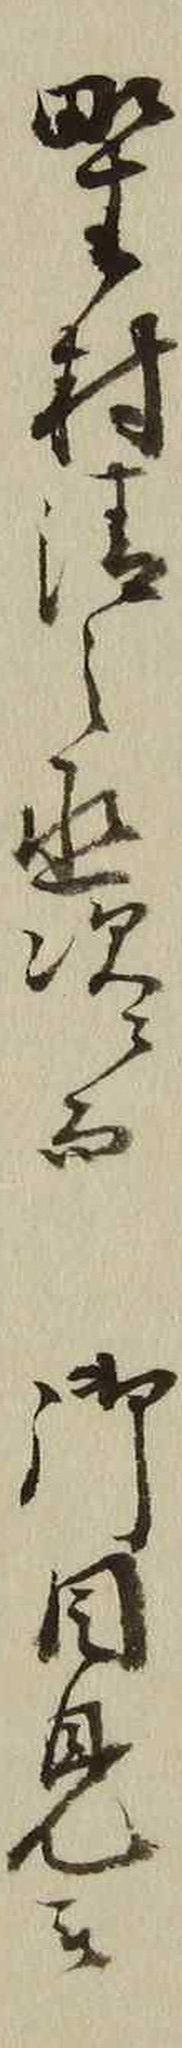野村清之丞次ニ而御目見被
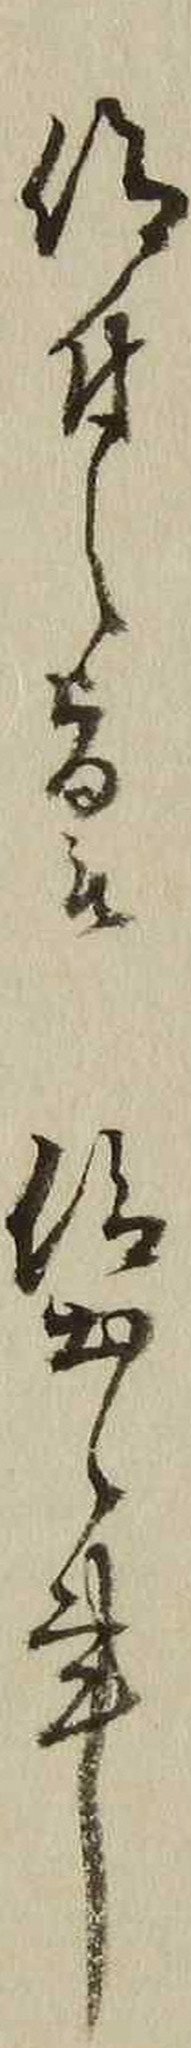仰付候旨被仰出候事
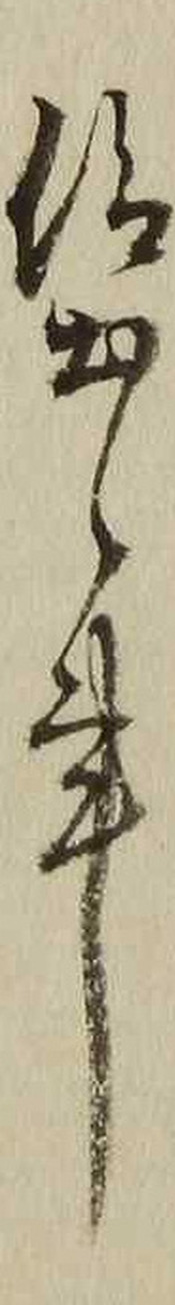仰付候事
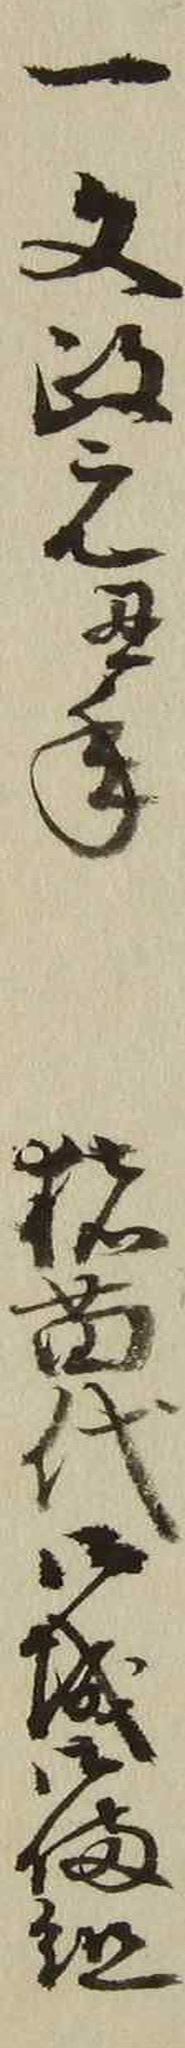一文政元丑年猪苗代御城御備組
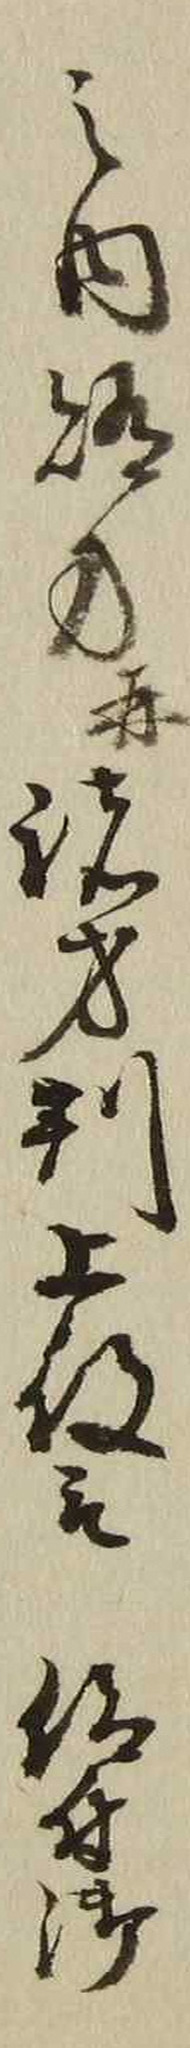之内賄方并諸才判上役被仰付御
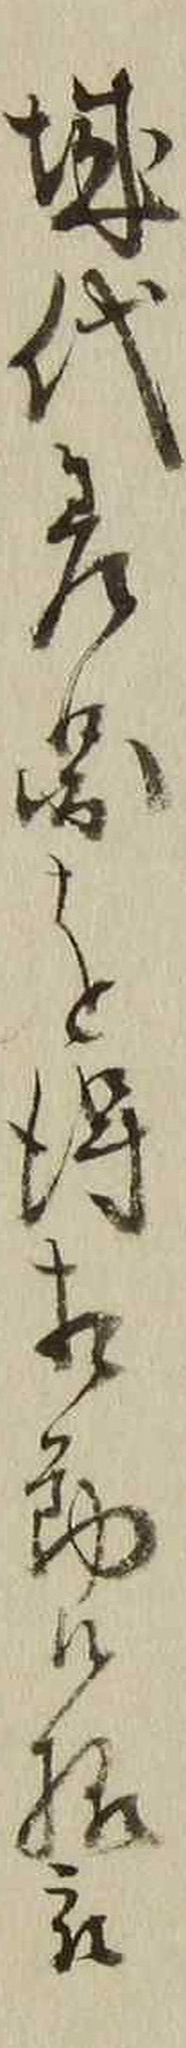城代差図を得合勤候様被
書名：諸士系譜　巻之36　は之部4
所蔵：会津若松市立会津図書館
